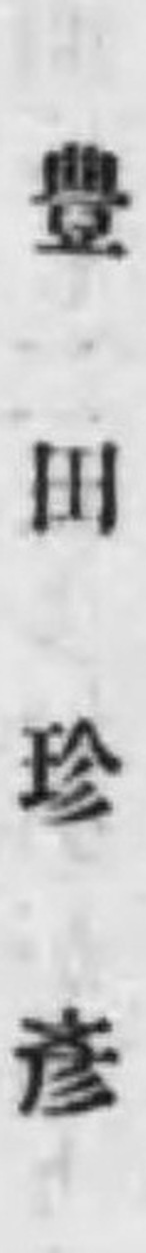豊田珍彦
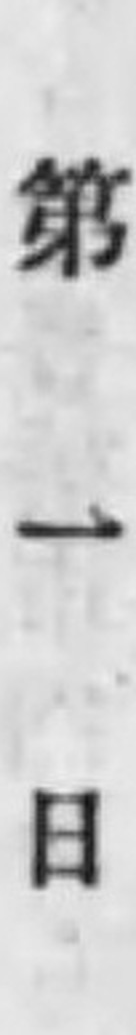第一日
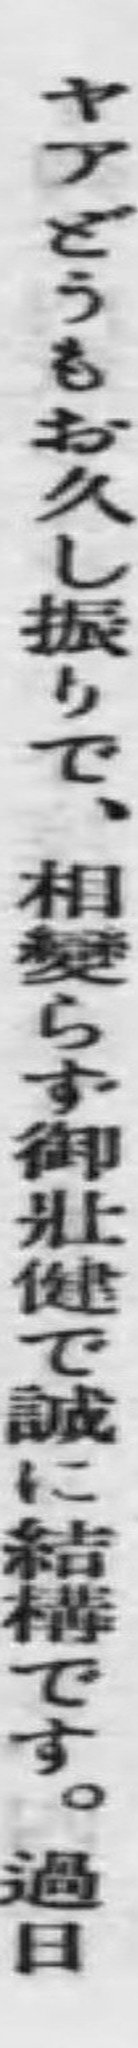ヤアどうもお久し振りで、相變らず御壮健で誠に結構です。過日
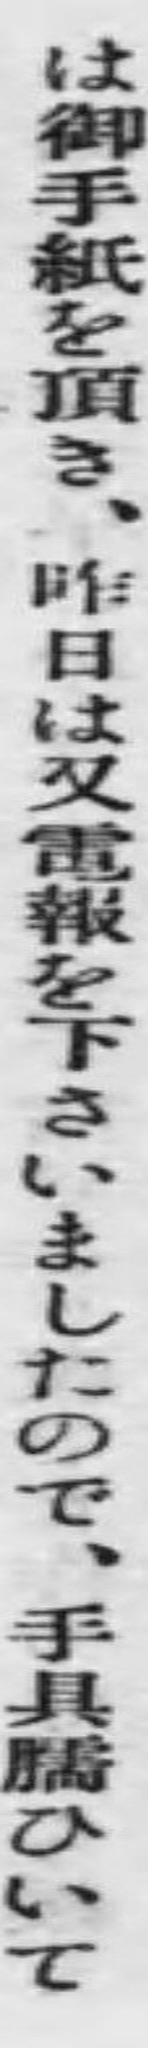は御手紙を頂き、昨日は又電報を下さいましたので、手具臑ひいて
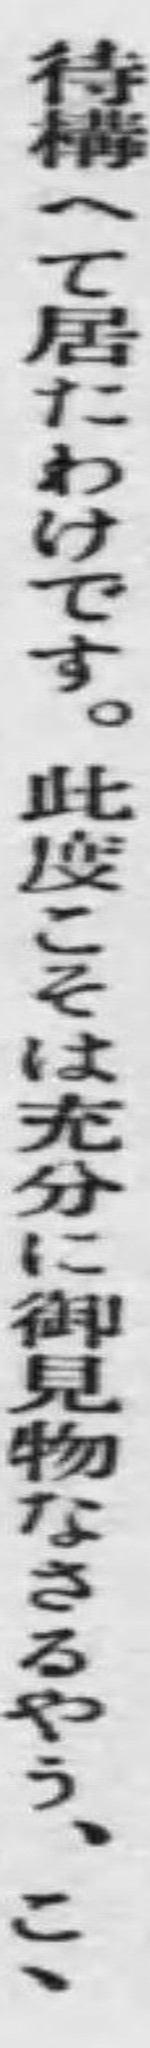待構へて居たわけです。此度こそは充分に御見物なさるやう、こヽ
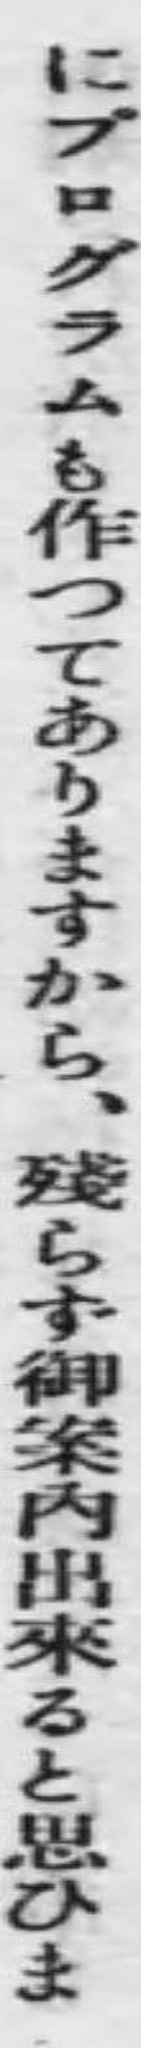にプログラムも作つてありますから、残らず御案内出來ると思ひま
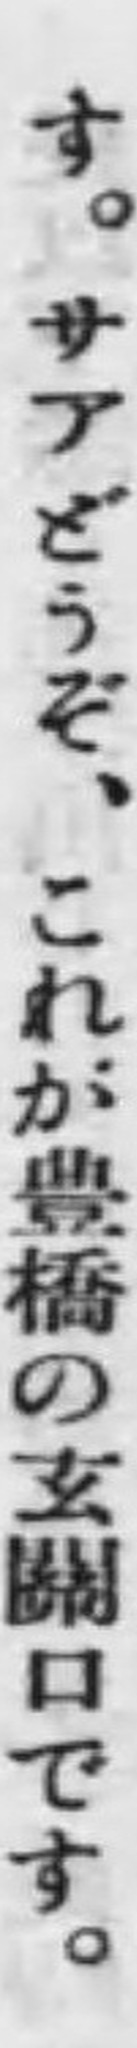す。サアどうぞ、これが豊橋の玄關口です。
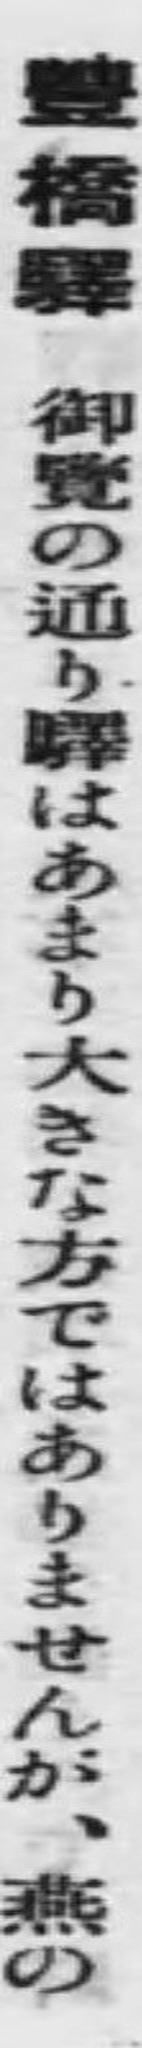豊橋驛御覧の通り驛はあまり大きい方ではありませんが、燕の
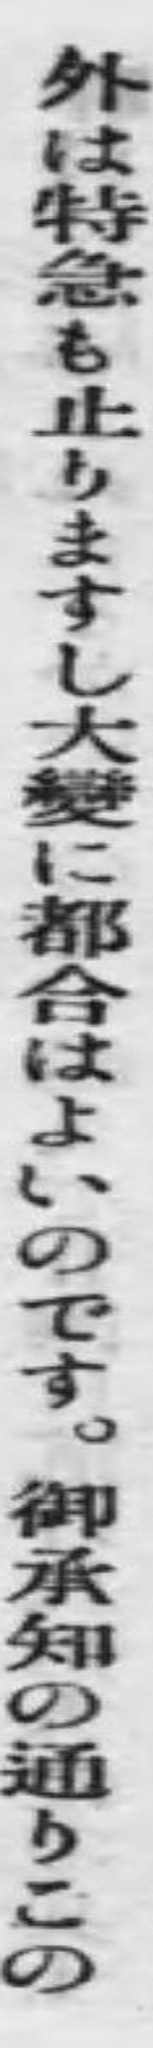外は特急も止りますし大變に都合はよいのです。ご承知の通りこの
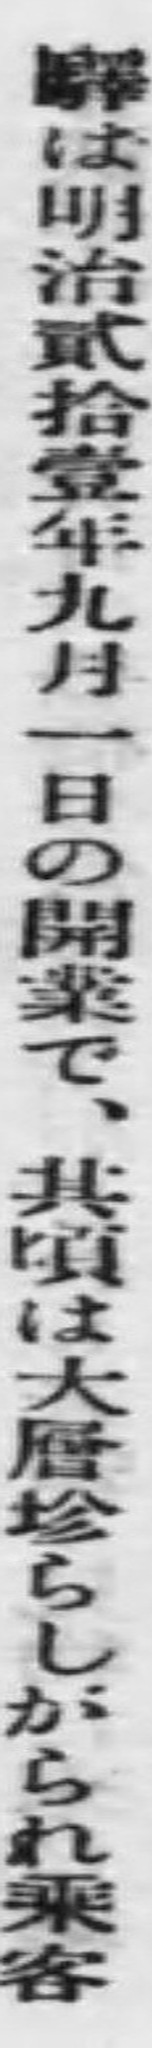驛は明治貳拾壹年九月一日の開業で、其頃は大層珍らしがられ乗客
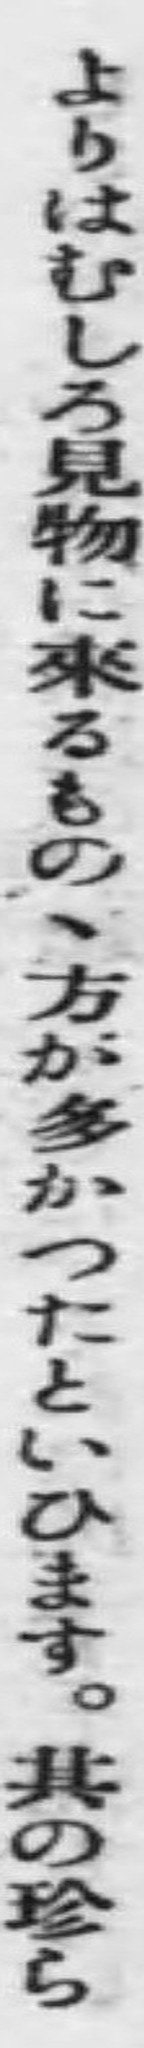よりはむしろ見物に來るものヽ方が多かつたといひます。其の珍ら

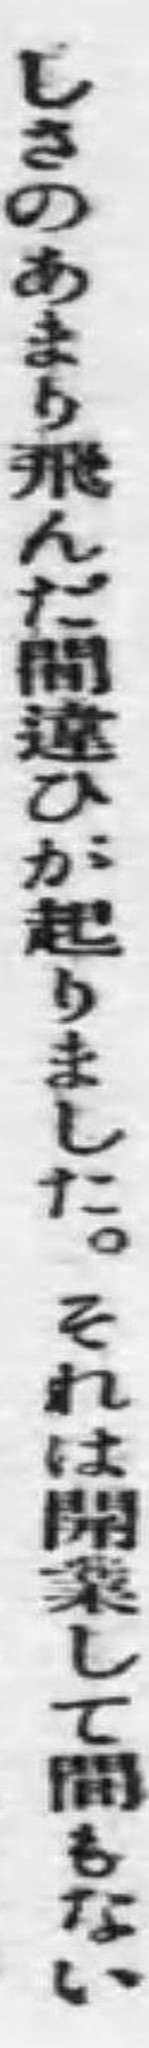しさのあまり飛んだ間違ひが起りました。それは開業して間もない
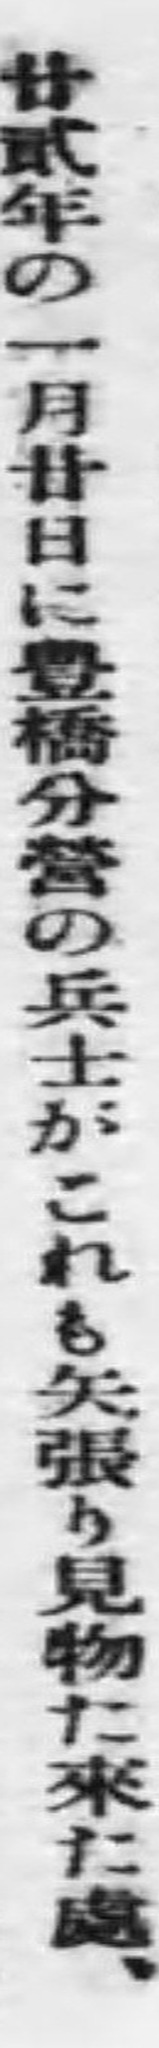廿貳年の一月廿日に豊橋分營の兵士がこれも矢張り見物た來た處、
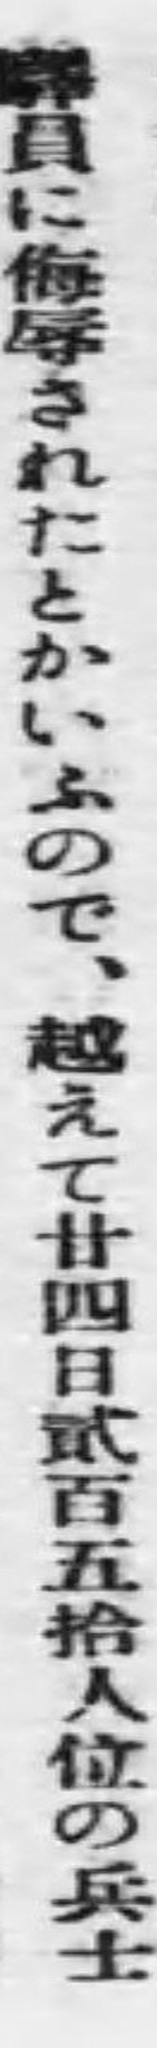驛員に侮辱されたとかいふので、越えて廿四日貳百五拾人位の兵士
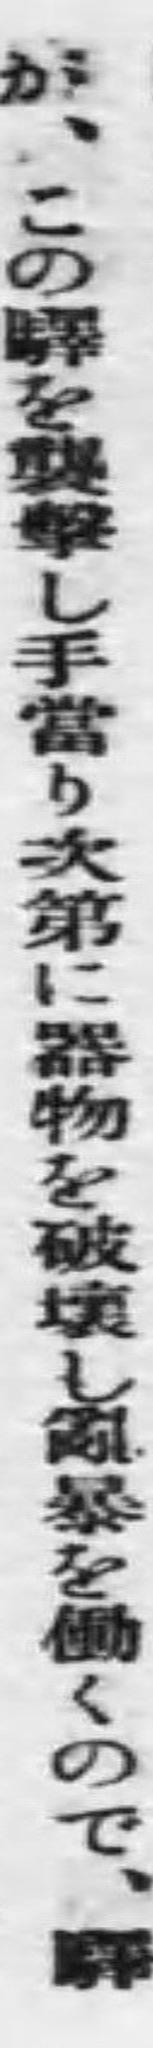が、この驛を襲撃し手當り次第に器物を破壊し亂暴を働くので、驛
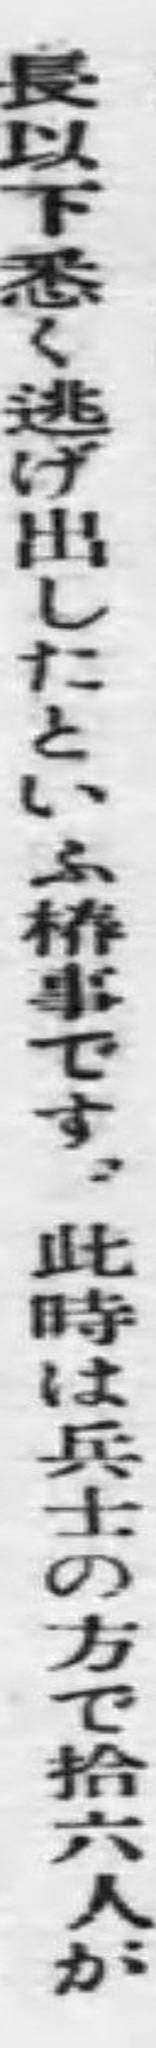長以下悉く逃げ出したといふ椿事です。此時は兵士の方で拾六人が
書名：東三河道中記 : 豊橋市及其附近案内
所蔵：国立国会図書館 National Diet Library, JAPAN
